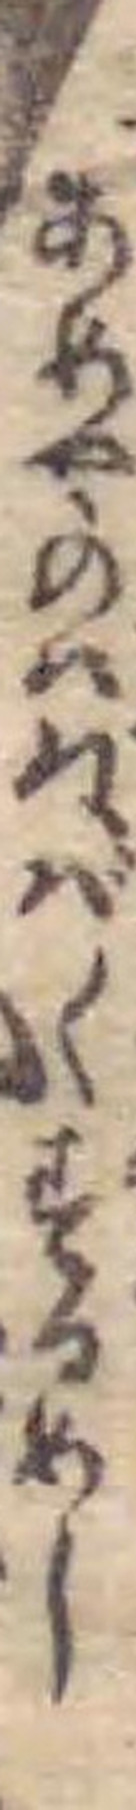あめやのはねば〳〵するめし
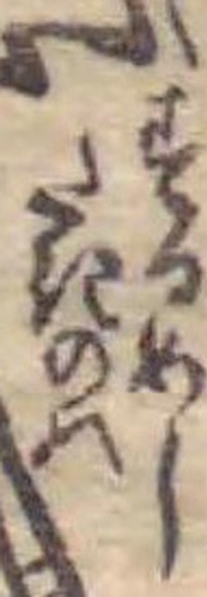たきのは
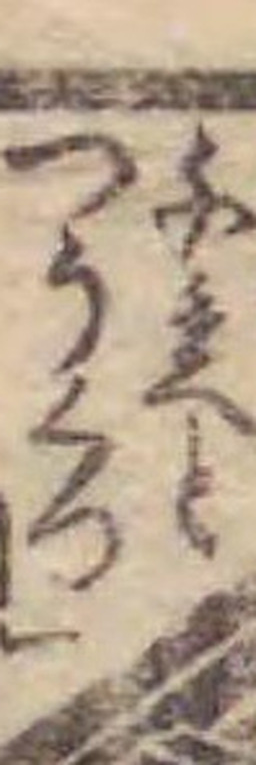つうくつし
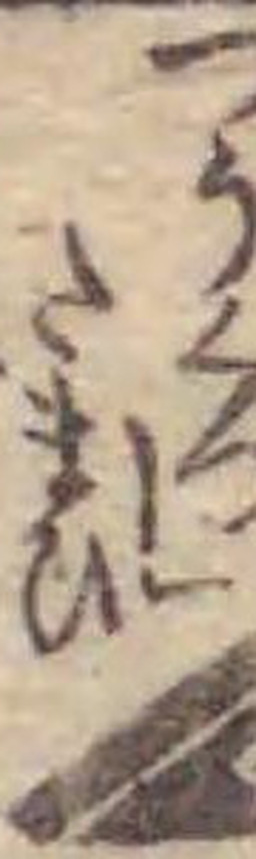たまひ
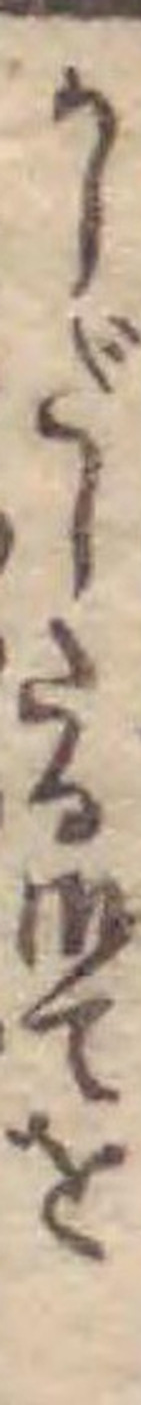かしだしたる御手を
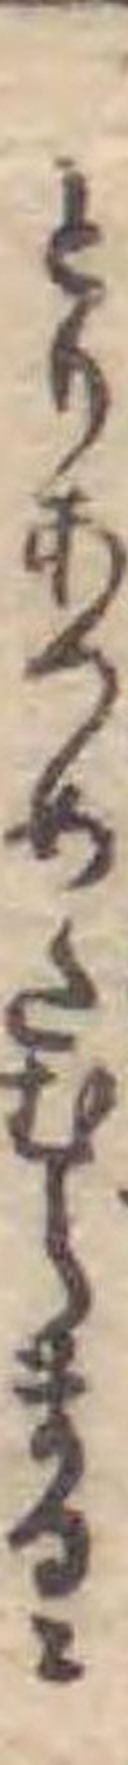とりあつめたむらまるに
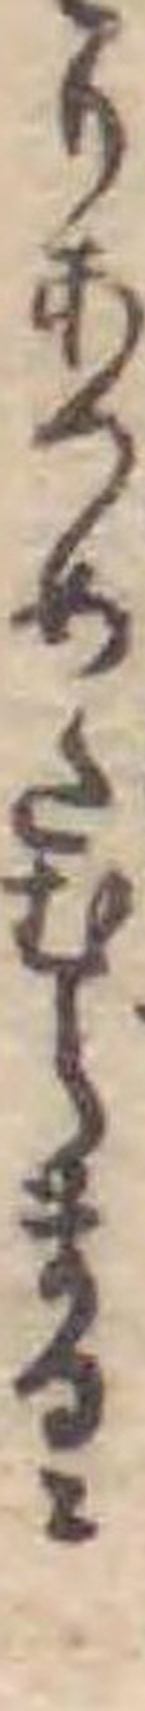とりあつめたむらまるに
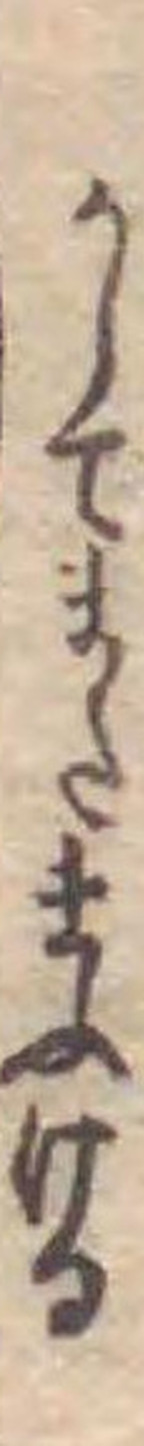かしてまたまふける
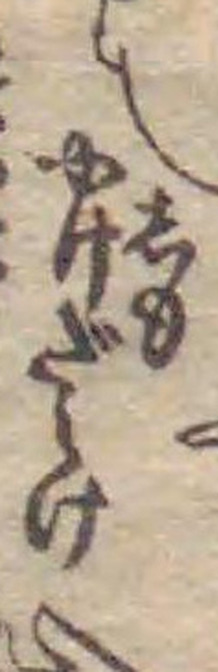やけだらけ
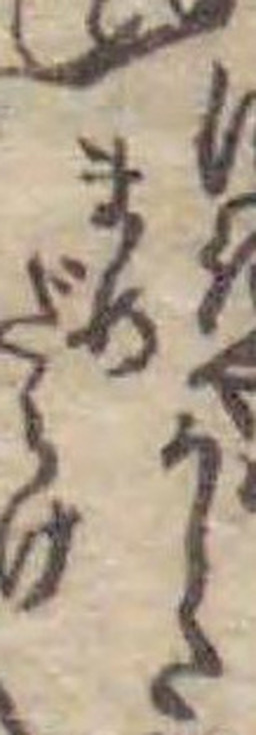だらけ
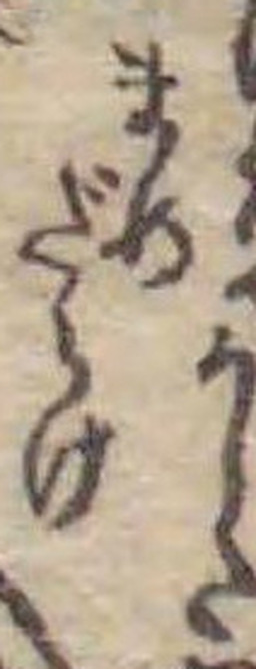だらけ

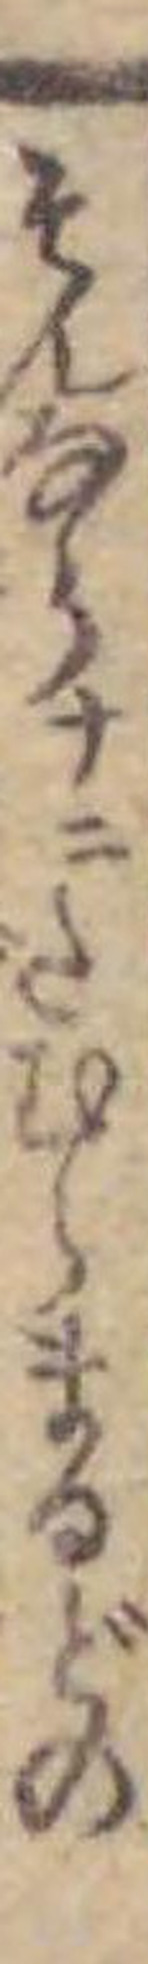そんならナニたむらまるどの
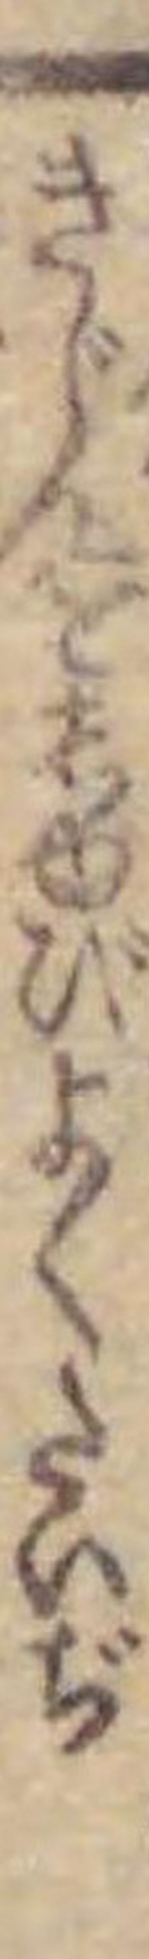きじんをしゆびよくたいぢ
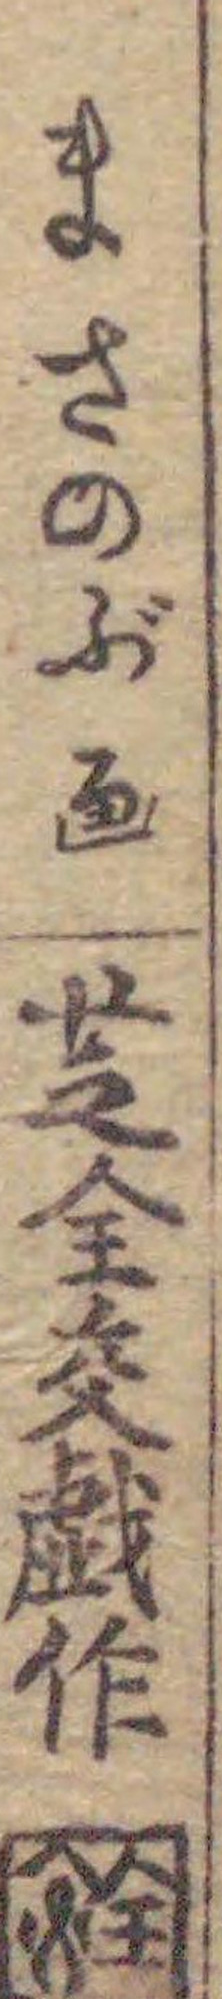まさのぶ画芝全交戯作
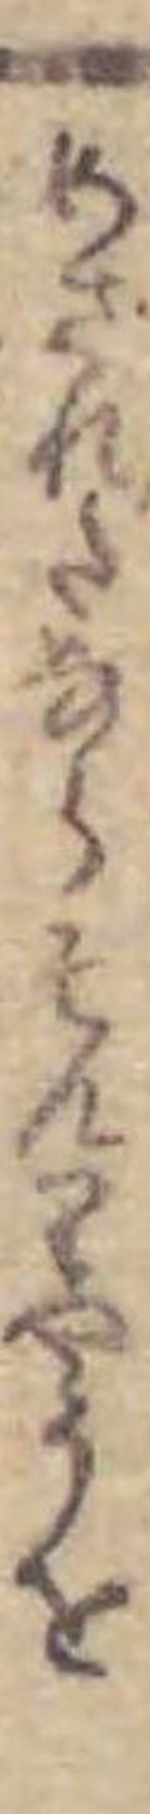めされたならそんりやうを
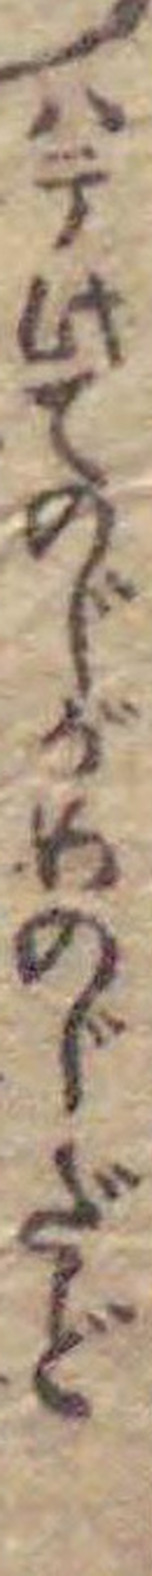ハテ此てのじがめのじだど
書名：大悲の千六本 : 1巻
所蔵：国立国会図書館 National Diet Library, JAPAN
